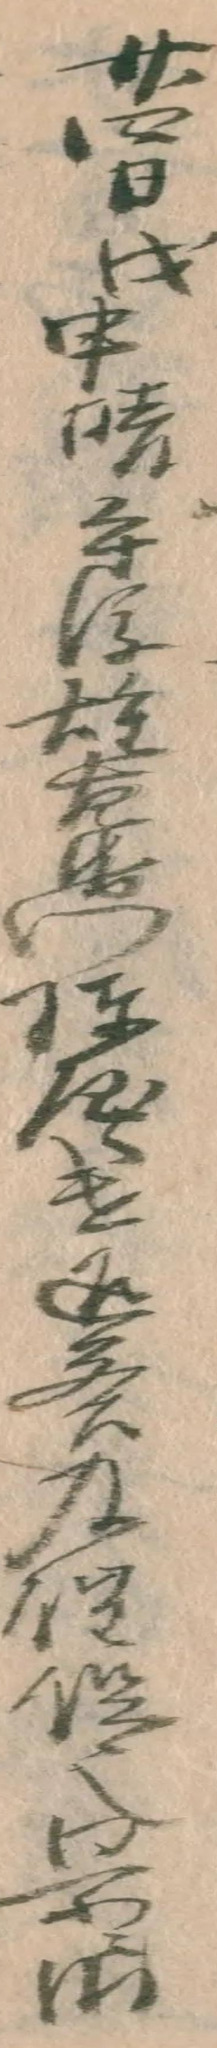廿四日戊申晴午後雄左衛門陣屋へ遣返答及催促也同所に泊
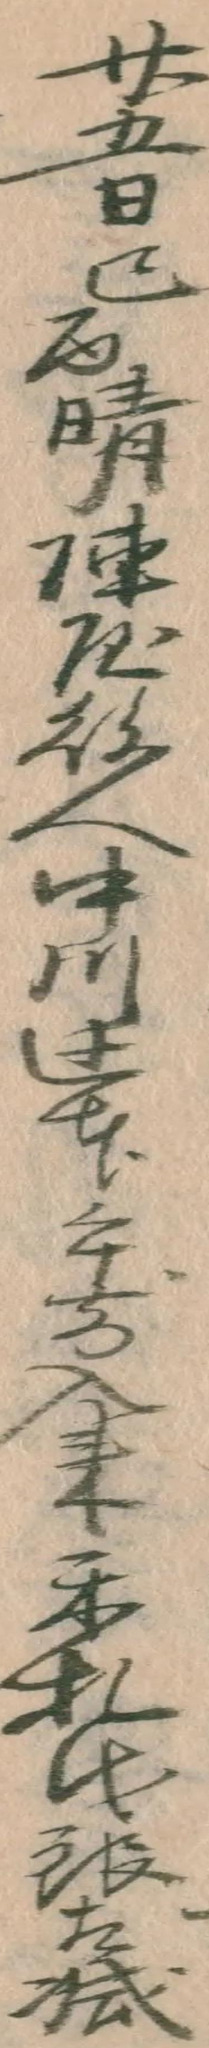廿五日己酉晴陣屋役人中川辻本午前入来米札代銀相減
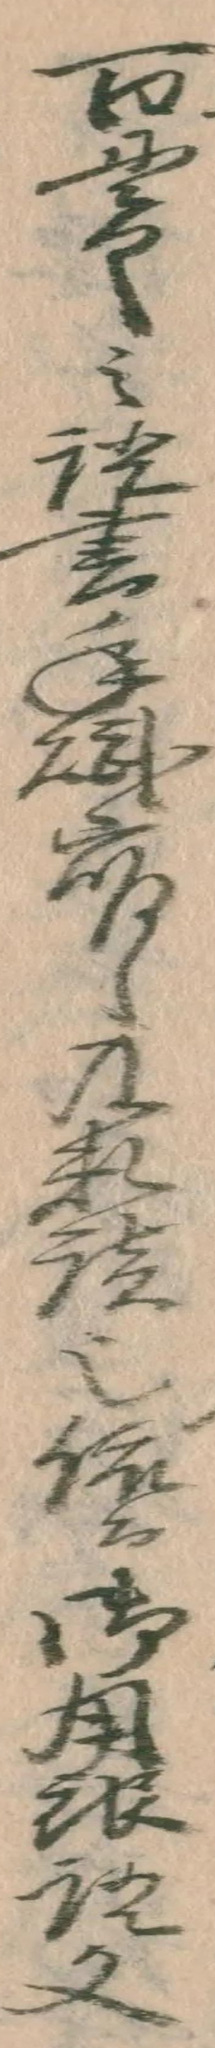百貫之證書年賦崩し及類談也依而御用銀證文
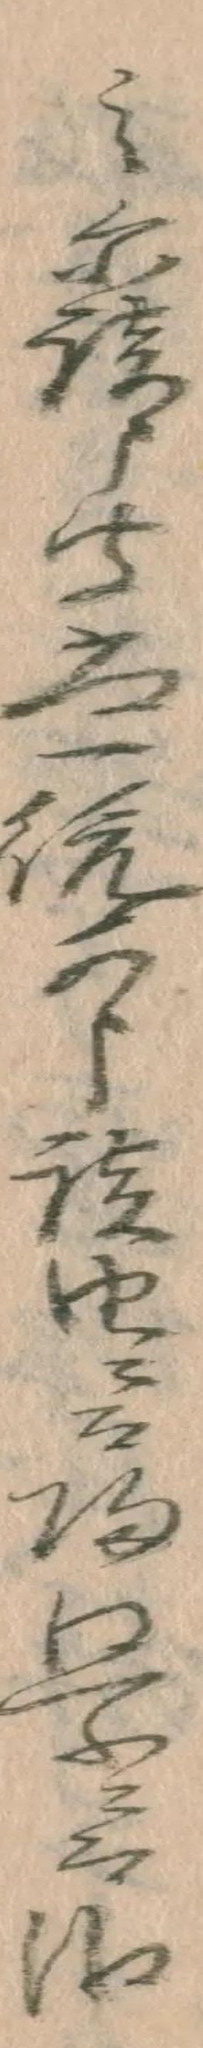之示談申聞尚一統可申談由ニ而帰同所ニ而泊
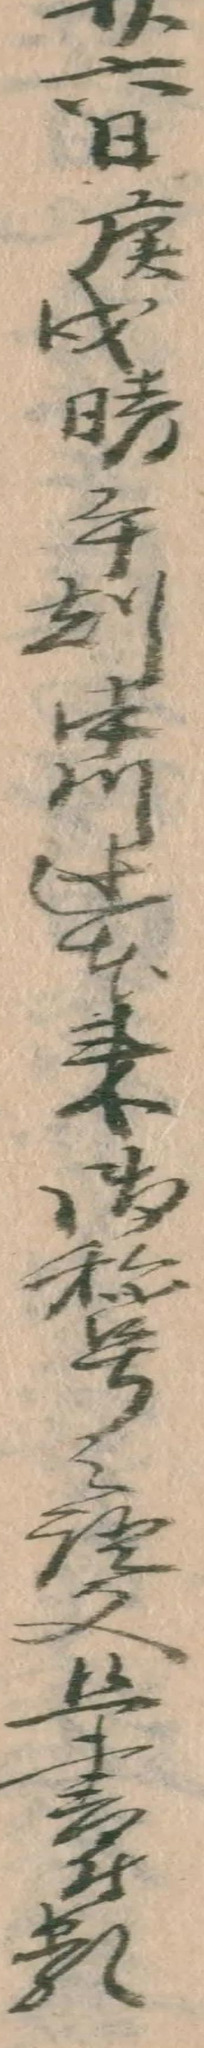廿六日庚戌晴午刻中川辻本来御称号之證文且書付類
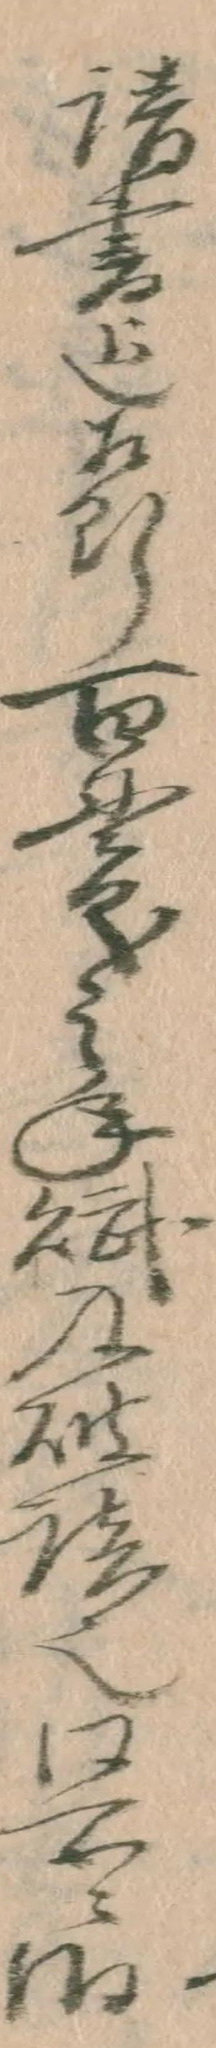請書迄相断百貫匁之年賦及破談也同所ニ泊
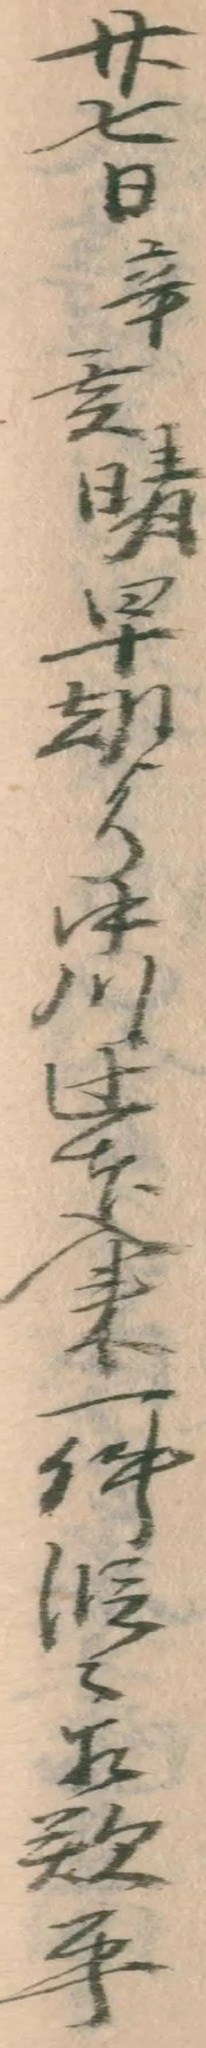廿七日辛亥晴早朝より中川辻在入来一件段々相歎平
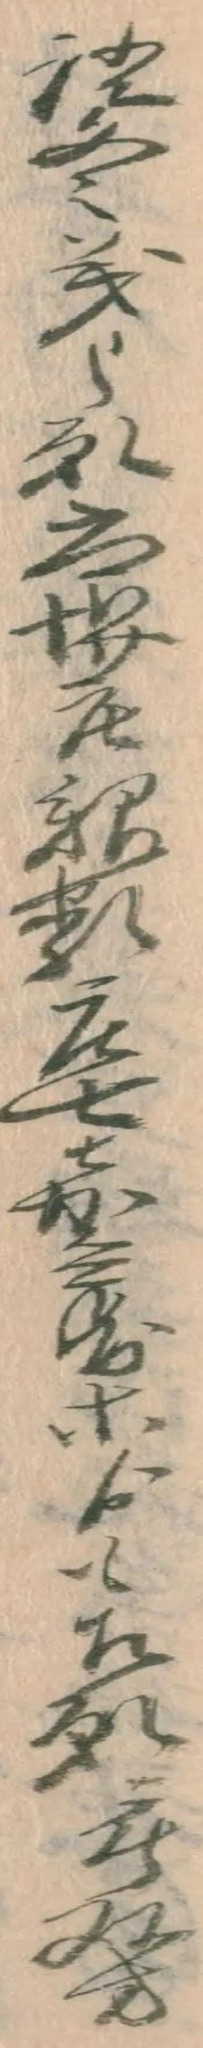證文之義申願尚堺并親類庄七嘉兵衛等ゟも相願ニ付双方
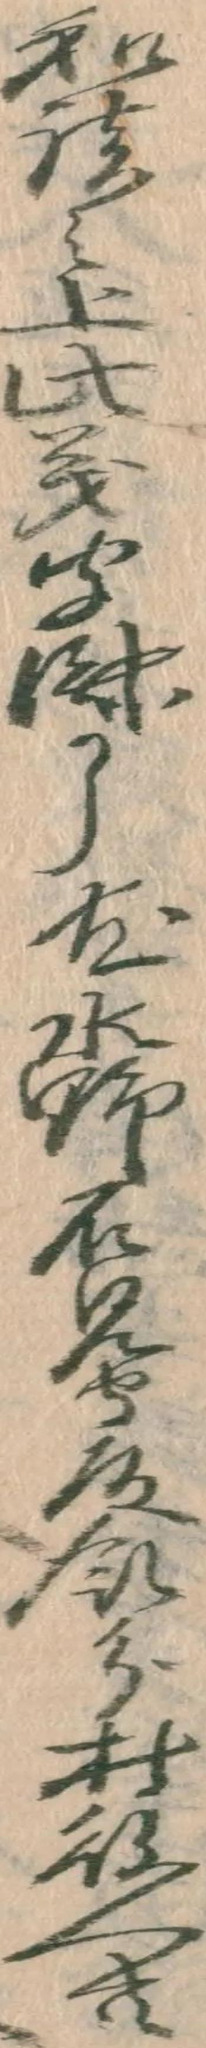和談之上此義聞済了尤水野石見守殿領分村役人共
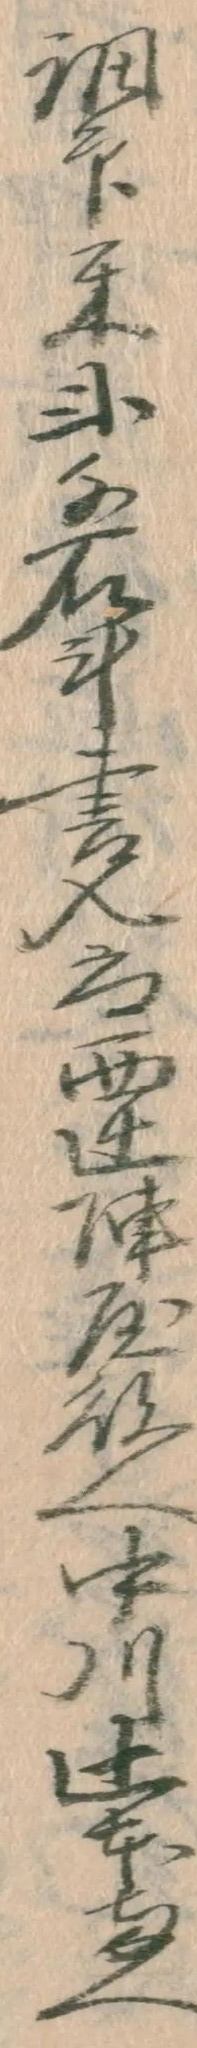調印米弐千石斗書入尚西辻陣屋役人中川辻本両人
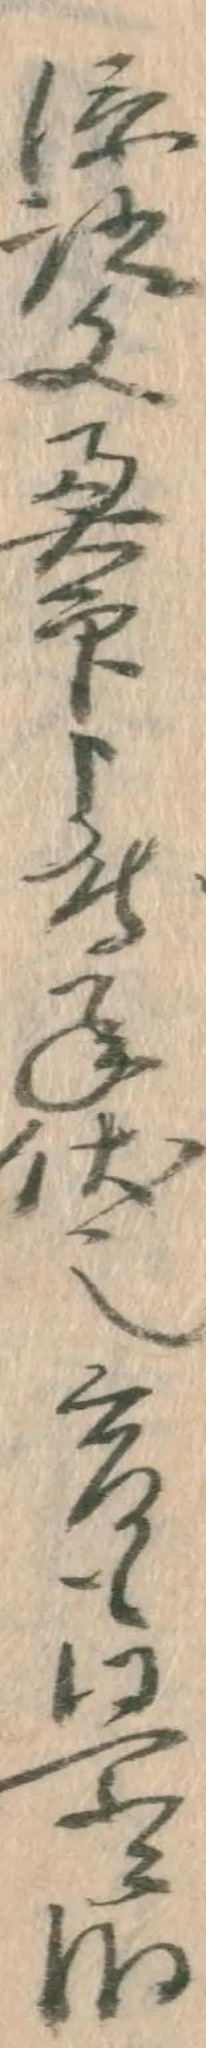添證文奥印申付承伏也今日も同所に泊
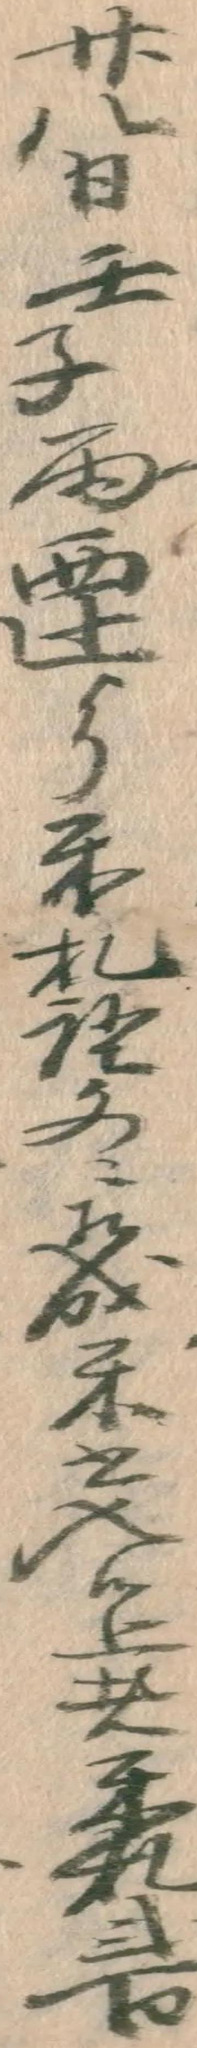廿八日壬子雨西辻より米札證文に相成米書入候上者米札弐百
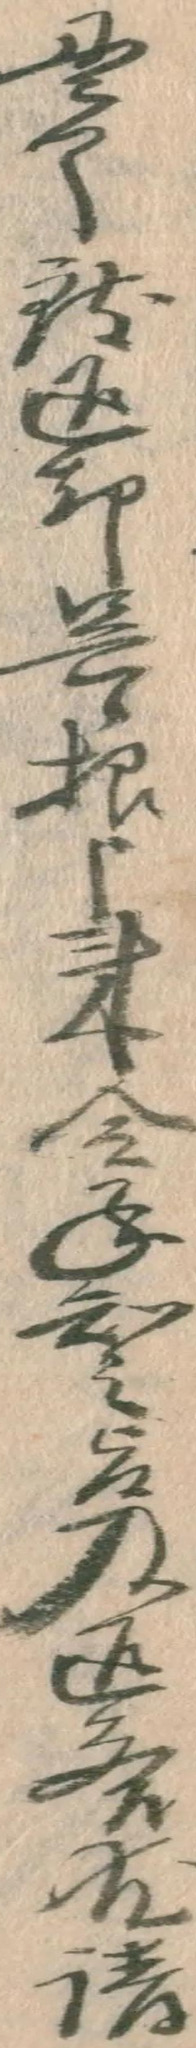貫ツヽ致退却呉候様申来令承知之旨及返答尤請
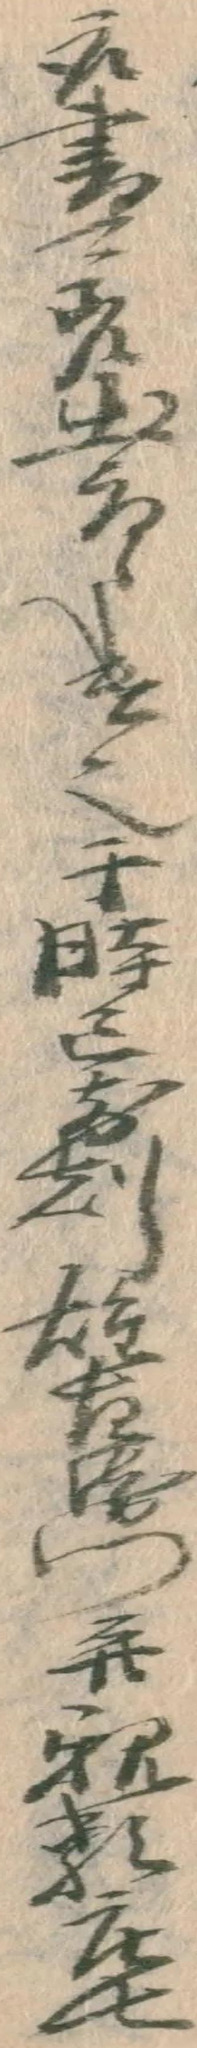取書可差出旨申遣也于時巳前刻雄左衛門幷親類庄七
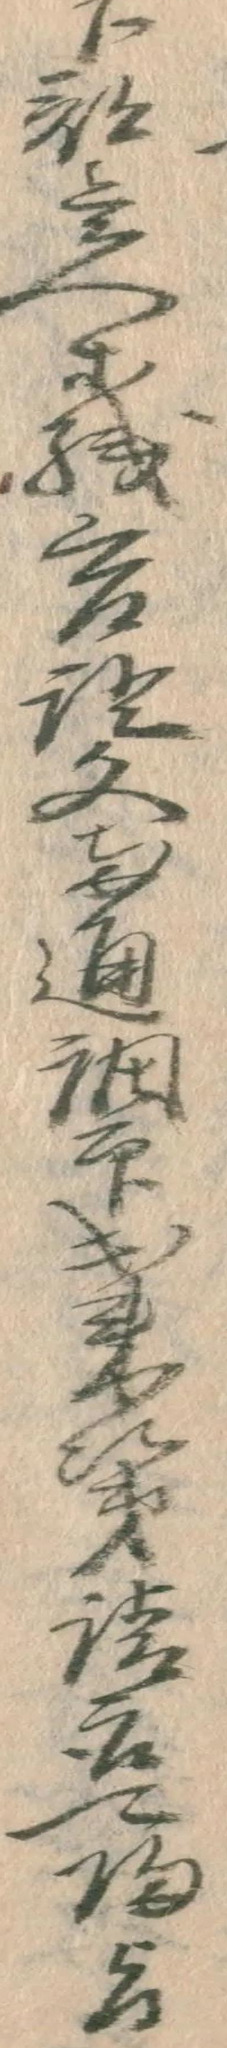下部壱人等残今日證文両通調印出来次第請取可帰旨
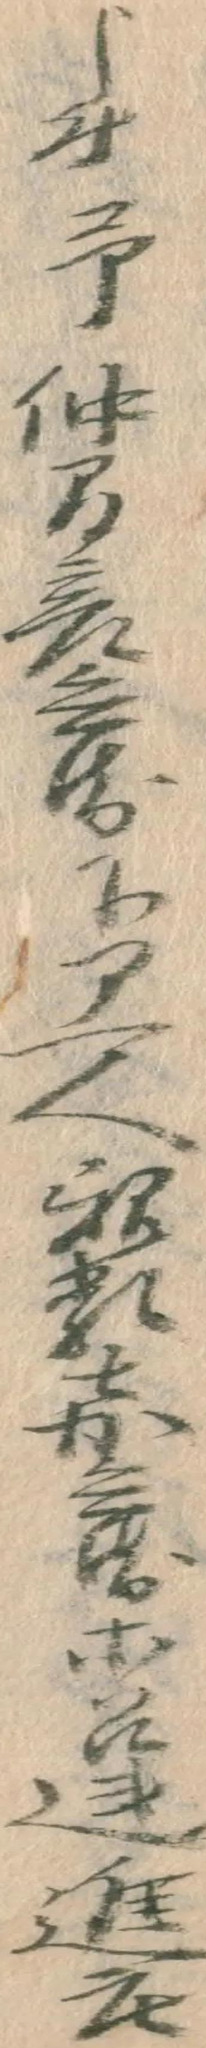申付予仲間彦兵衛下部一人親類嘉兵衛等召連進庄
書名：賀茂社記録. 第67冊
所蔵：国立国会図書館 National Diet Library, JAPAN
